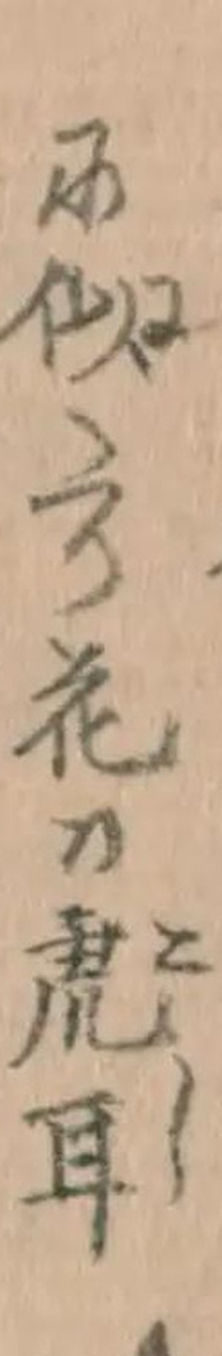に似たり花は虎耳
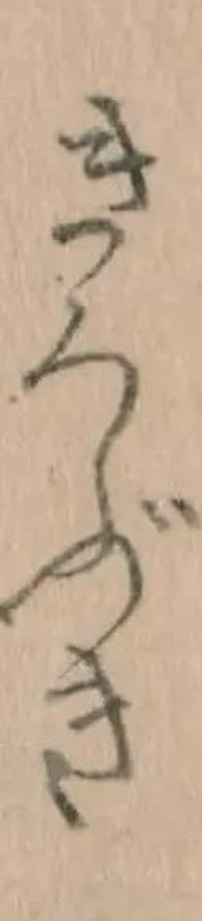きくぶき
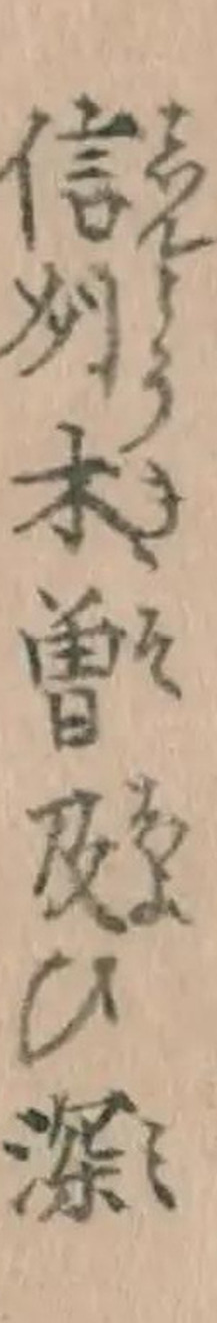信州木曽及ひ深
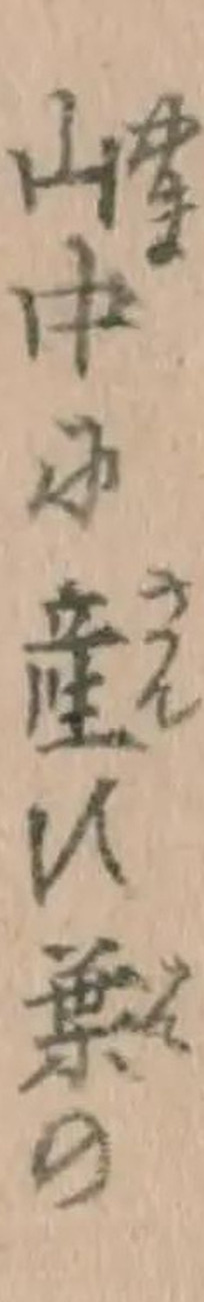山中に産す葉の
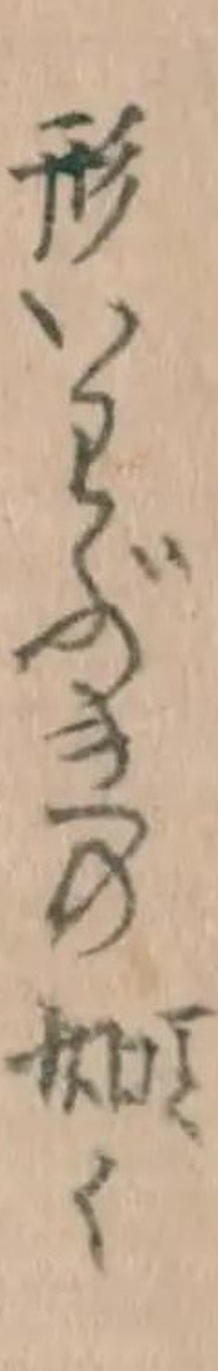形いわぶきの如く
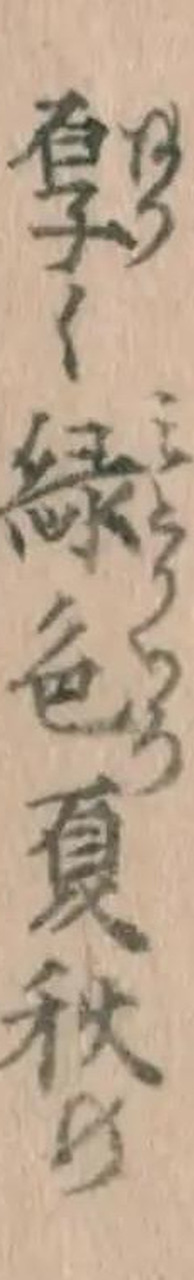厚く緑色夏秋の
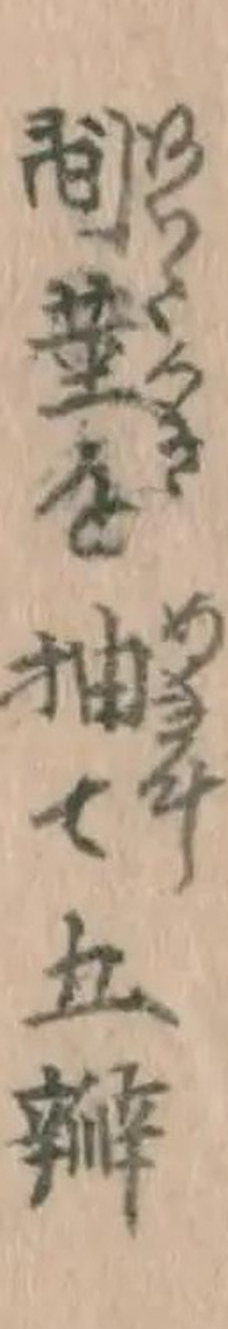間茎を抽て五弁
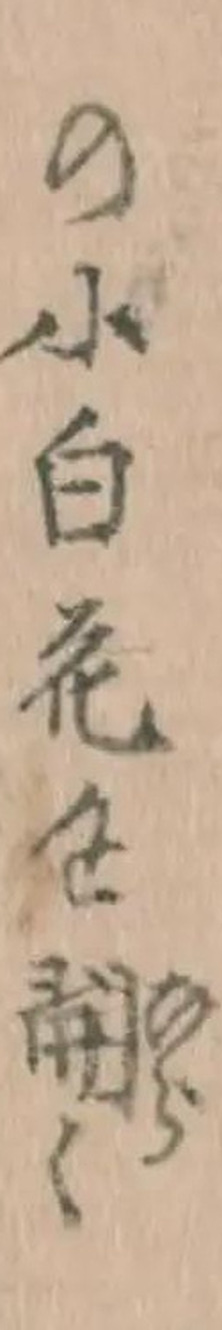の小白花を開く

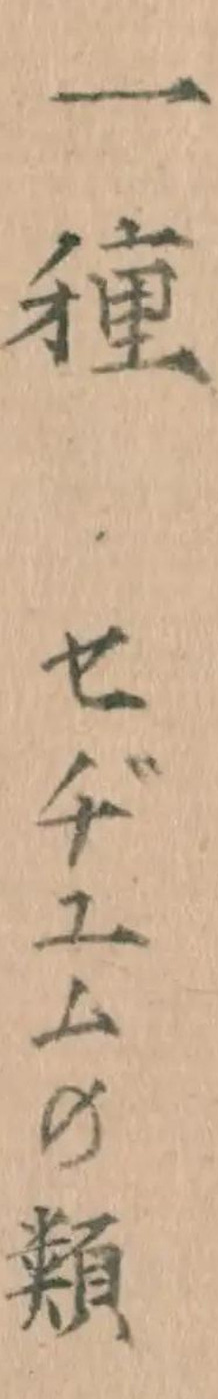一種セヂユムの類
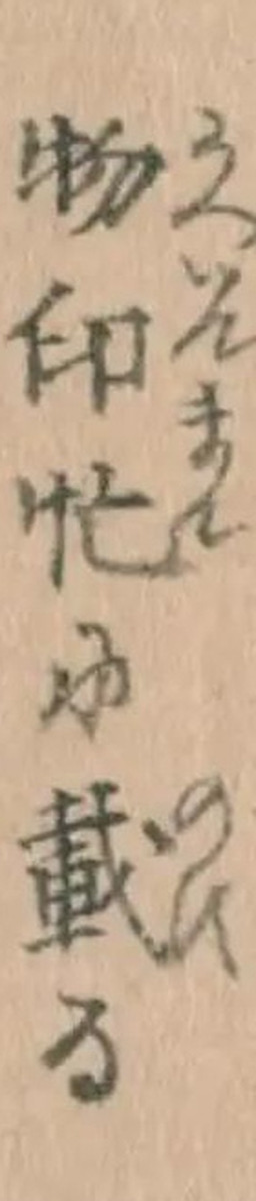物印忙に載る
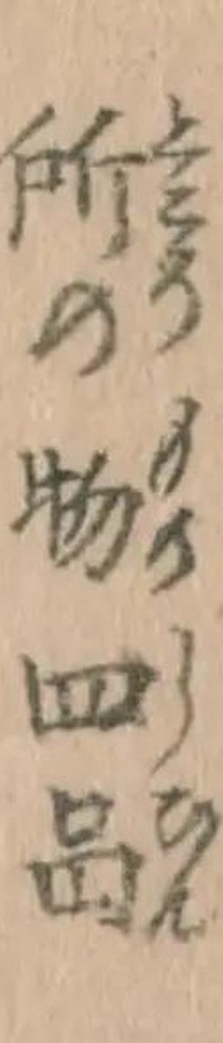所の物四品

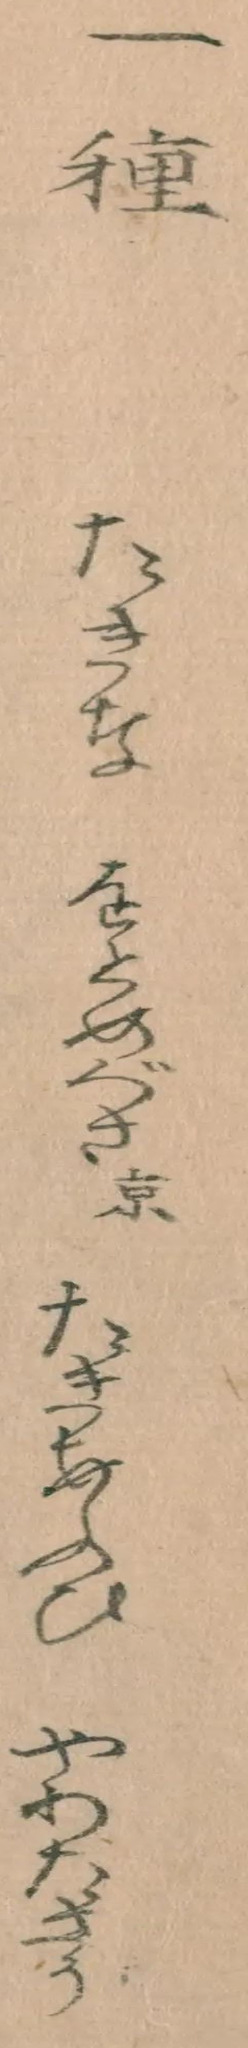一種たきなをとめぐさ京たきあふひやわたさう
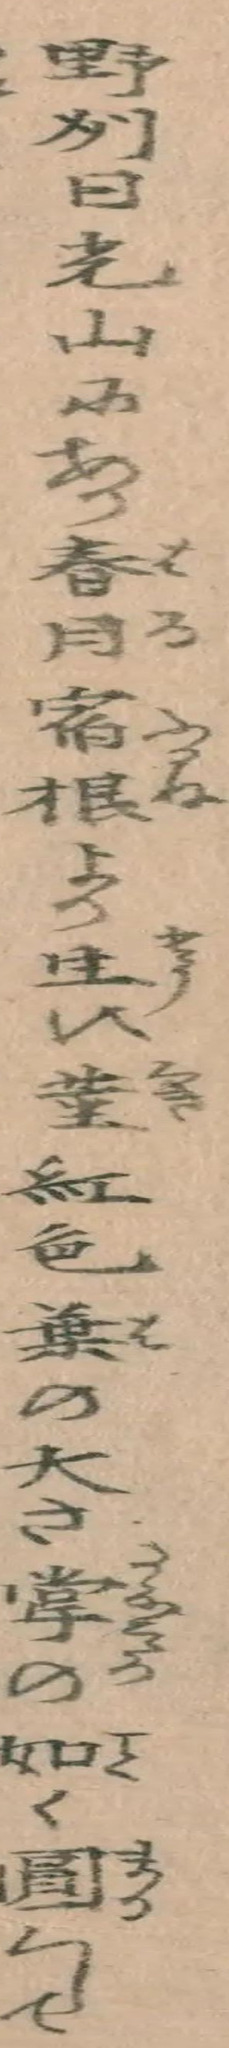野州日光山にあり春月宿根より生す茎紅色葉の大さ掌の如く円くして
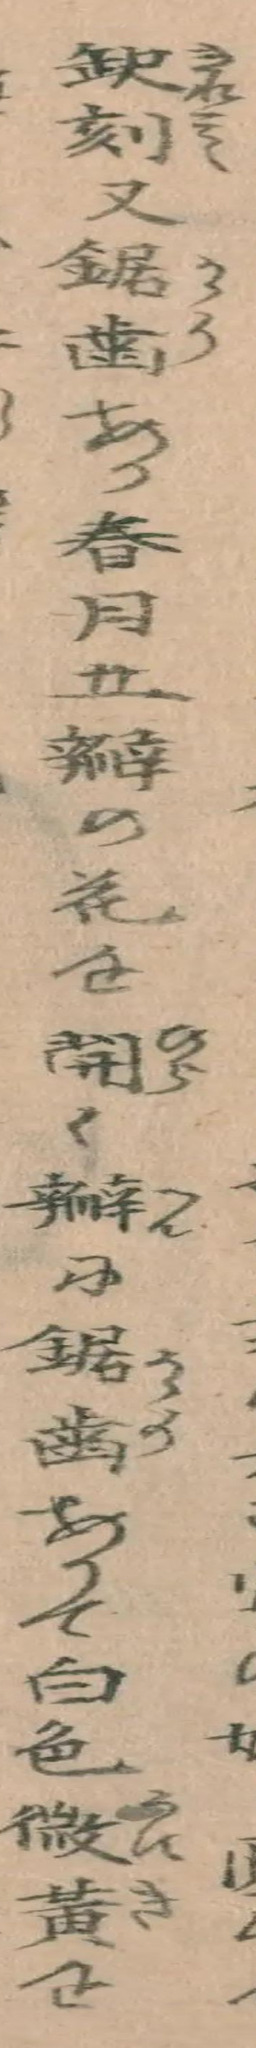欠刻又鋸歯あり春月五弁の花を開く弁に鋸歯ありて白色微黄を

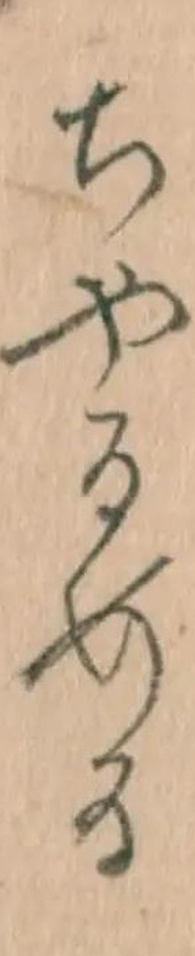ちやるめる
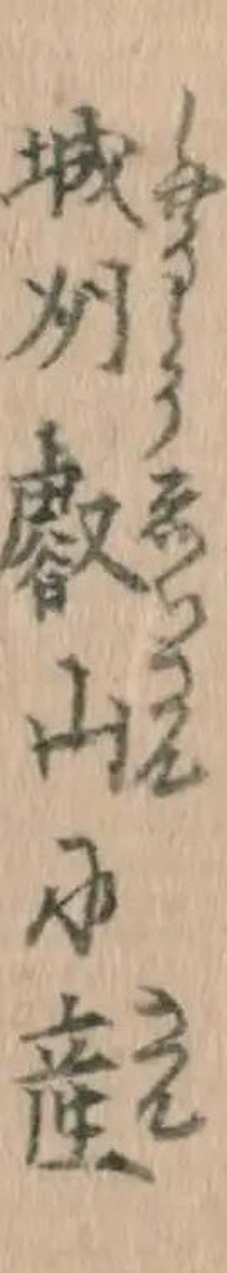城州叡山に産
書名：本草図譜. 巻34-36
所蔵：国立国会図書館 National Diet Library, JAPAN
